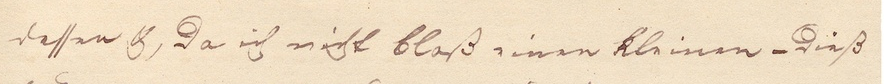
dessen &, da ich nicht bloß einen kleinen – dieß
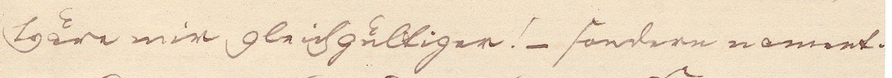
wäre mir gleichgültiger! – sondern nament-
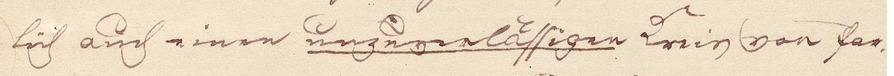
lich auch einen unzuverlässigen Kreis von Par-
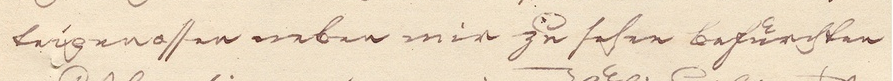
teigenossen neben mir zu haben befürchten
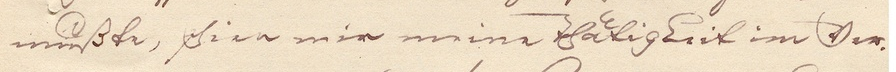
mußte, schien mir meine Thätigkeit im Ver-
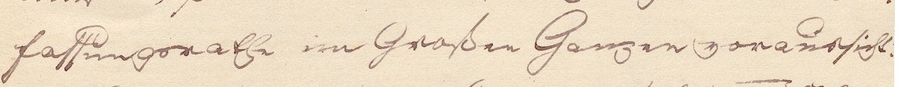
fassungsrathe im Großen Ganzen voraussicht-
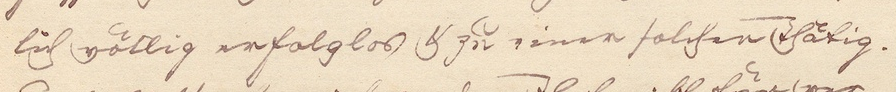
lich völlig erfolglos & zu einer solchen Thätig-
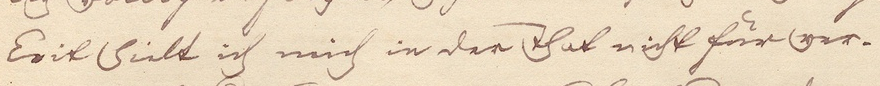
keit hielt ich mich in der That nicht für ver-
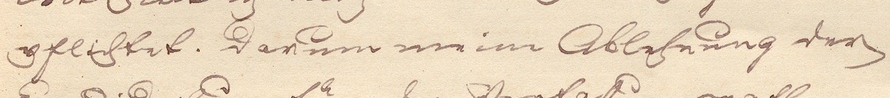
pflichtet. Darum meine Ablehnung der
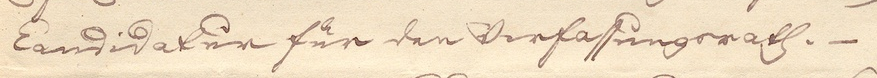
Candidatur für den Verfassungsrath. –
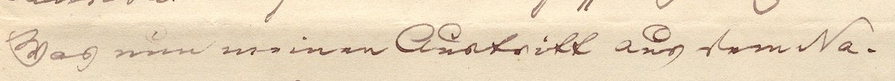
Was nun meinen Austritt aus dem Na-
